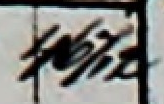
467,2
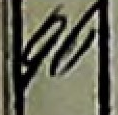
96
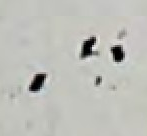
do
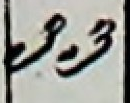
33
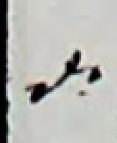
do
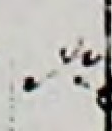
do
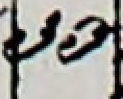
33
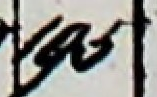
195
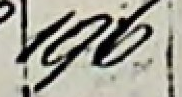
196
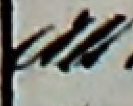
Alt
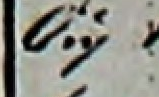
Aus„
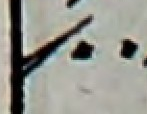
see „
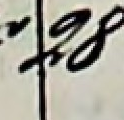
28
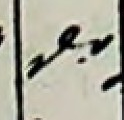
do
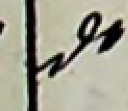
do
